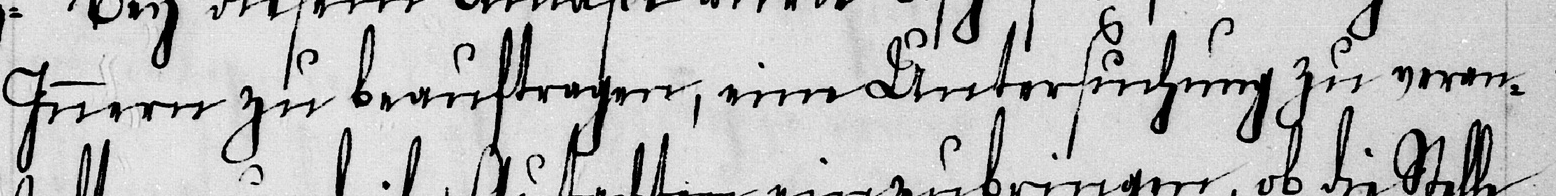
Innern zu beauftragen, eine Untersuchung zu veran¬
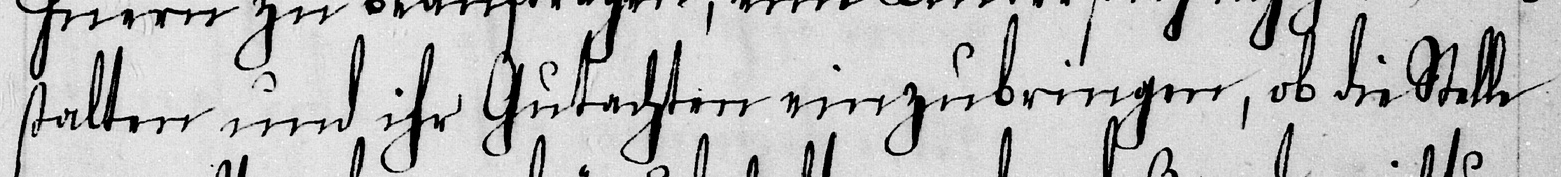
stalten und ihr Gutachten einzubringen, ob die Stelle
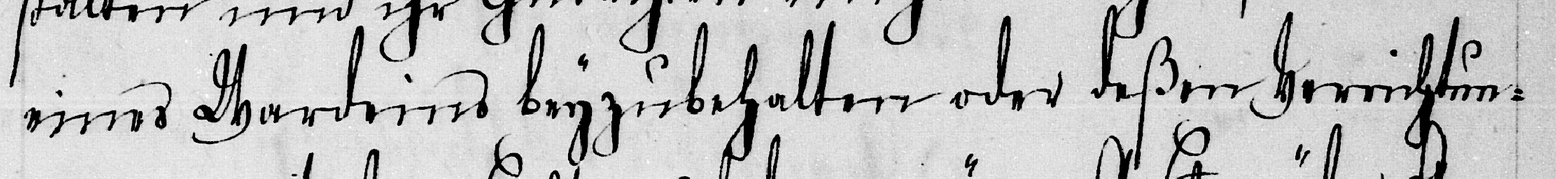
eines Wardeins beizubehalten oder deßen Verrichtun¬
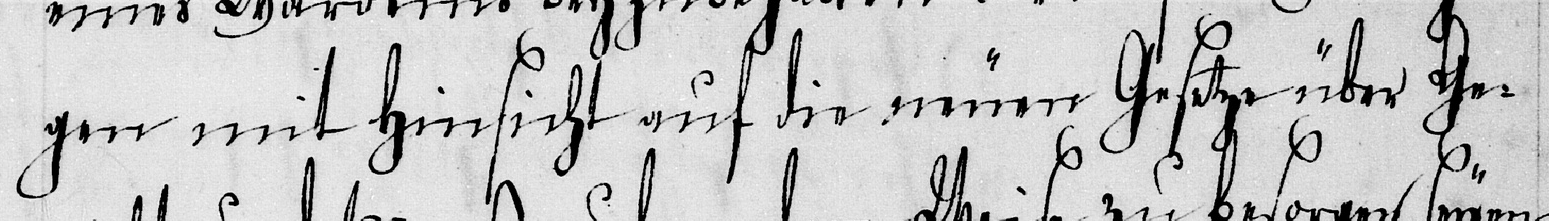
gen mit Hinsicht auf die neuen Gesetze über Ge¬
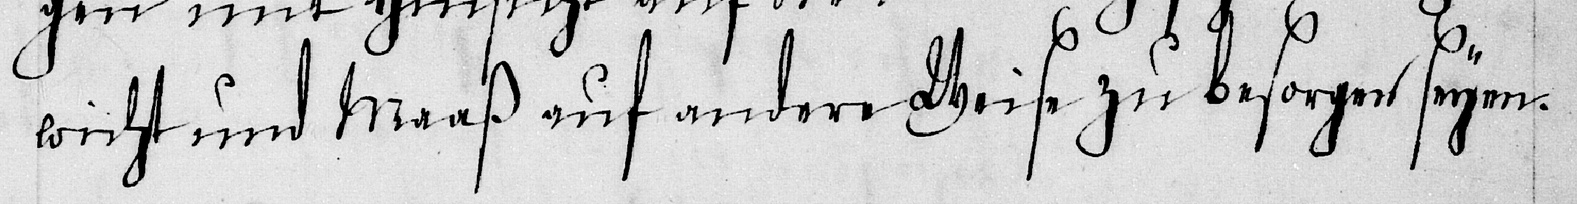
wicht und Maß auf andere Weise zu besorgen seyen.
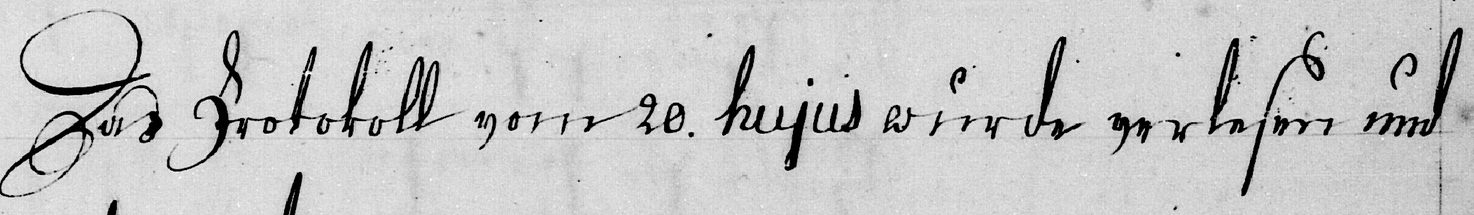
Das Protokoll vom 20. hujus wurde verlesen und
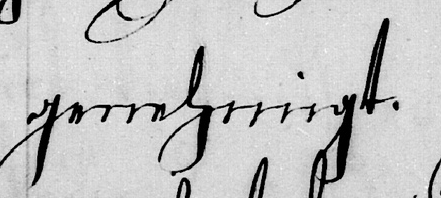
genehmigt.
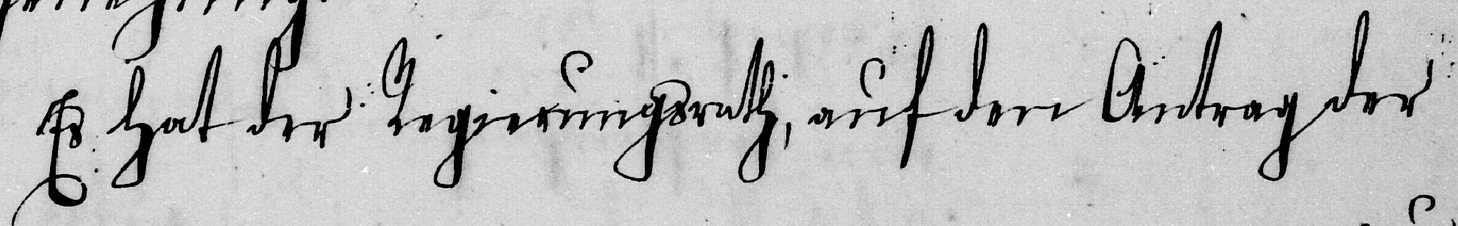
Es hat der Regierungsrath, auf den Antrag der
